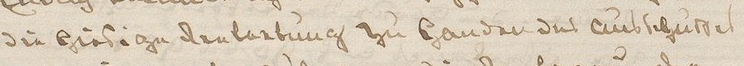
die hiesige Vertretung zu Handen des Ausschusses
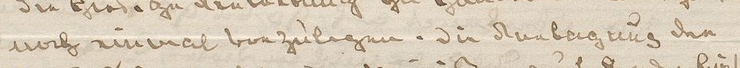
noch einmal vorzulegen. Die Vertagung der
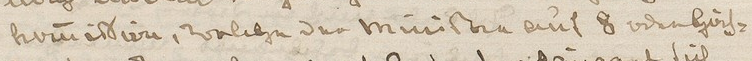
Kommission, welche der Minister auf 8 oder höch-
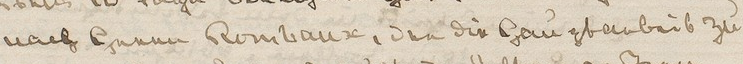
nach Herrn Rombaux, der die Hauptarbeit zu
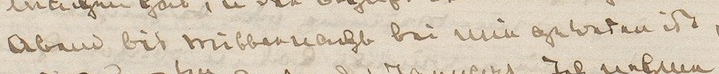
Abend bis Mitternacht bei mir gewesen ist,
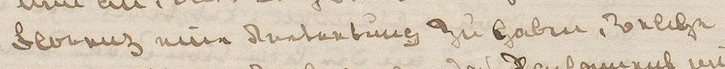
Florenz eine Vertretung zu haben, welche
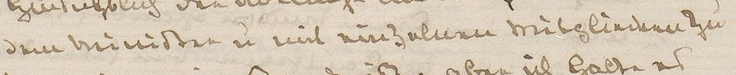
dem Minister u mit einzelnen Mitgliedern zu
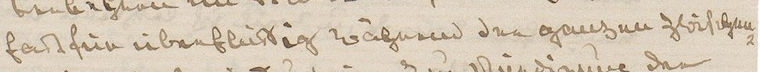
fast für überflüssig während der ganzen Zwischen-
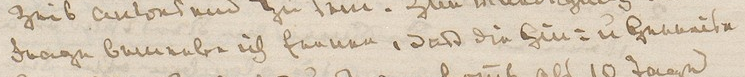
Frage bemerke ich ferner, daß die Hin- u Herreise
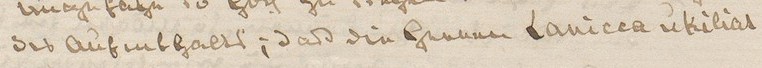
des Aufenthalts; daß die Herren Lanicca u Kilias
